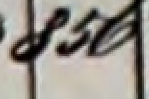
856
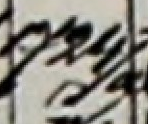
1724/a
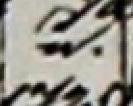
u.
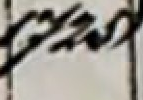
1725
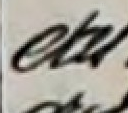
Alt
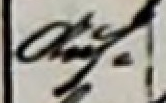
Auf„
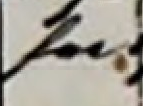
see
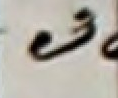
3
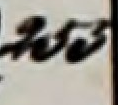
255
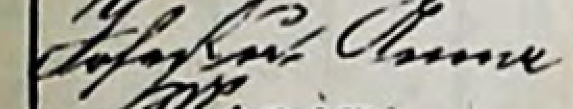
Josef u. Anna
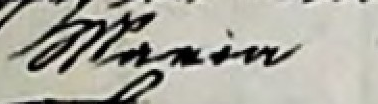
Maria
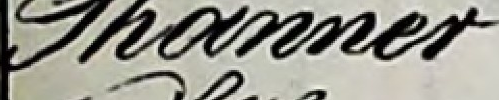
Thanner
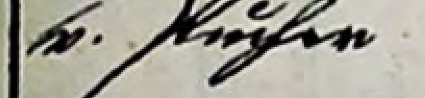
v. Pucher
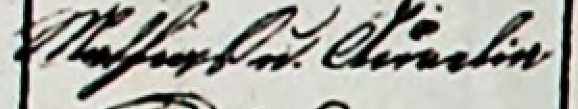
Mathias u. Aurelia
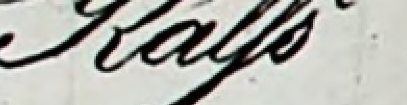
Kalss
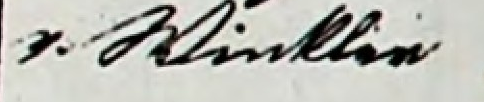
v. Winkler
